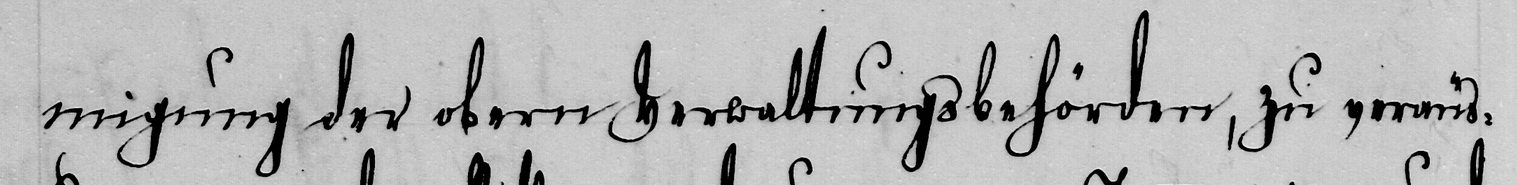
migung der obern Verwaltungsbehörden, zu veräuß¬
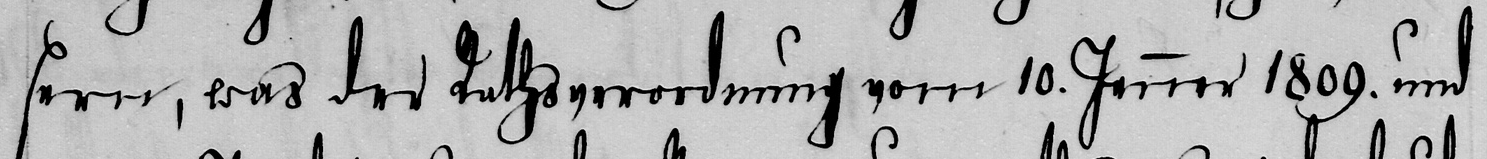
ern, was der Rathsverordnung vom 10. Jenner 1809. und
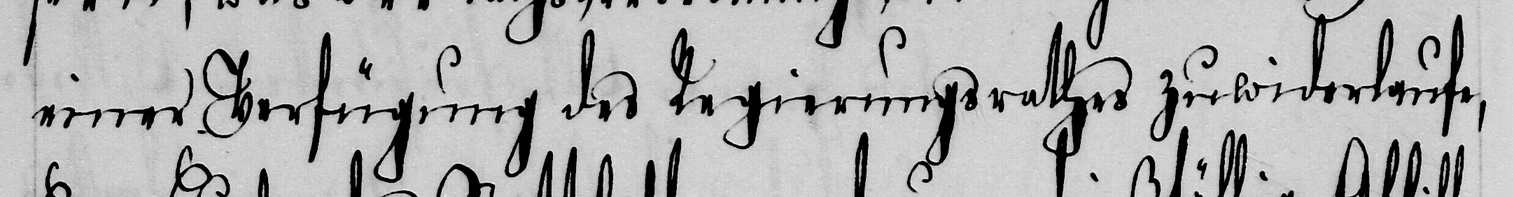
einer Verfügung des Regierungsrathes zuwiderlaufe,
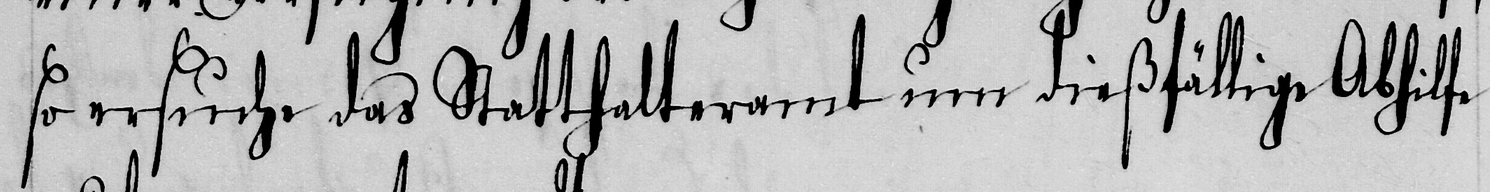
so ersuche das Statthalteramt um dießfällige Abhilfe
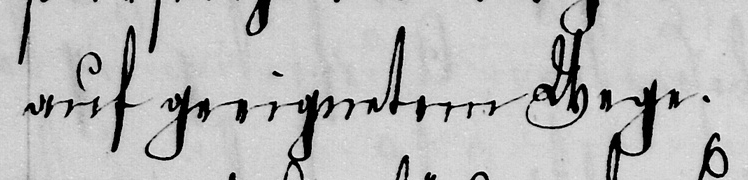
auf geeignetem Wege.
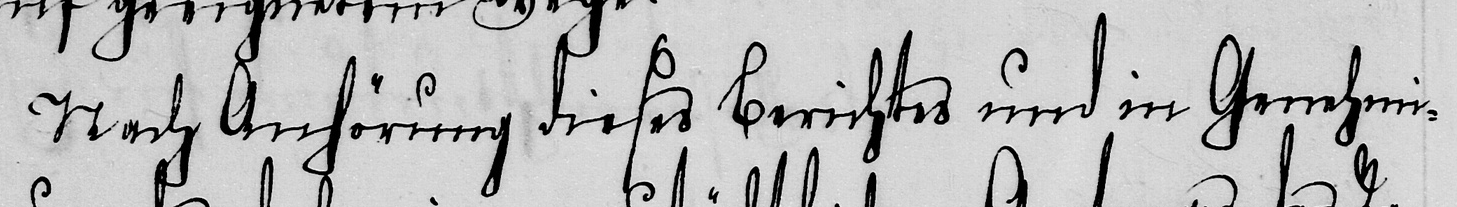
Nach Anhörung dieses Berichtes und in Genehmi¬
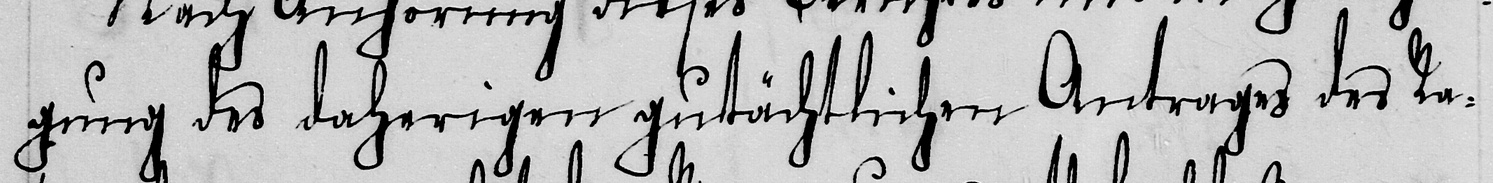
gung des daherigen gutächtlichen Antrages des Ra¬
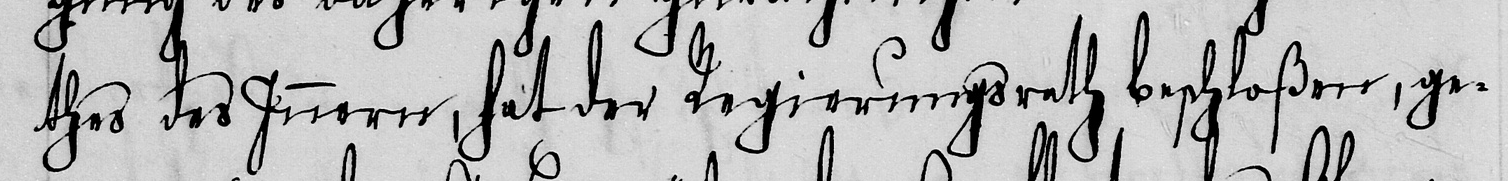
thes des Innern, hat der Regierungsrath beschloßen, ge¬
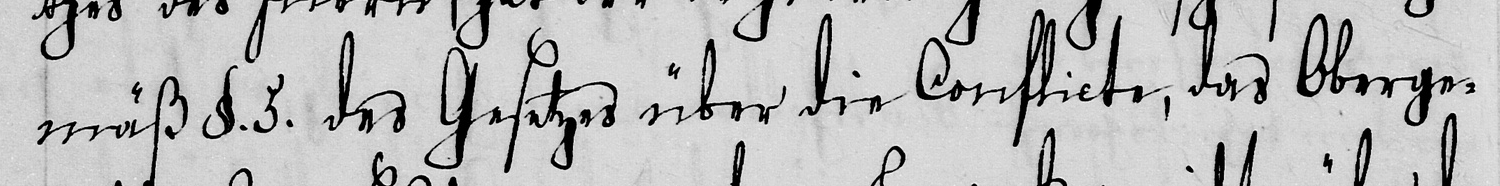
mäß §. 5. des Gesetzes über die Conflicte, das Oberge¬
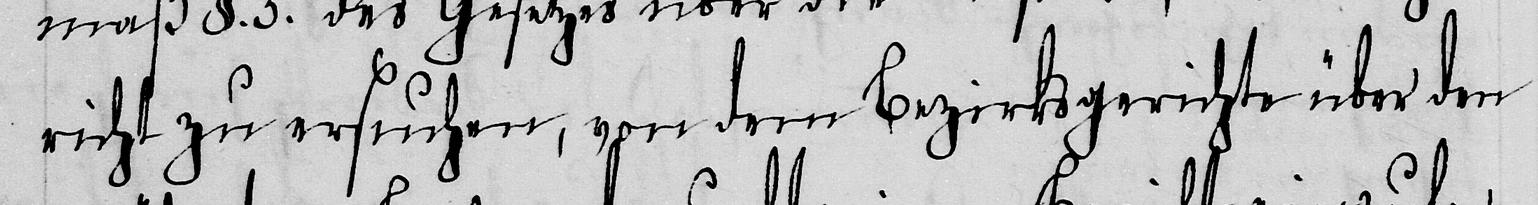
richt zu ersuchen, von dem Bezirksgerichte über den
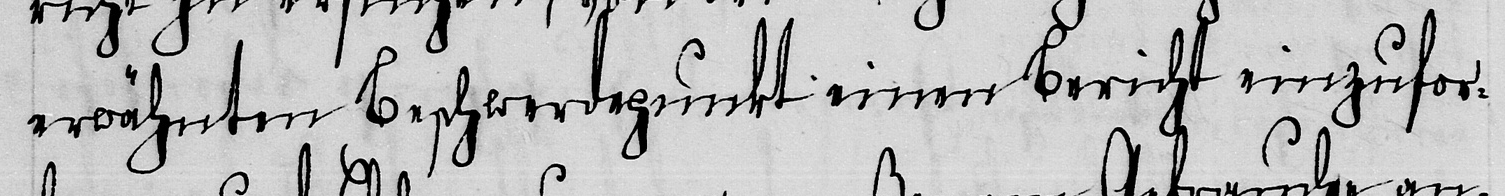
erwähnten Beschwerdepunkt einen Bericht einzufor¬
